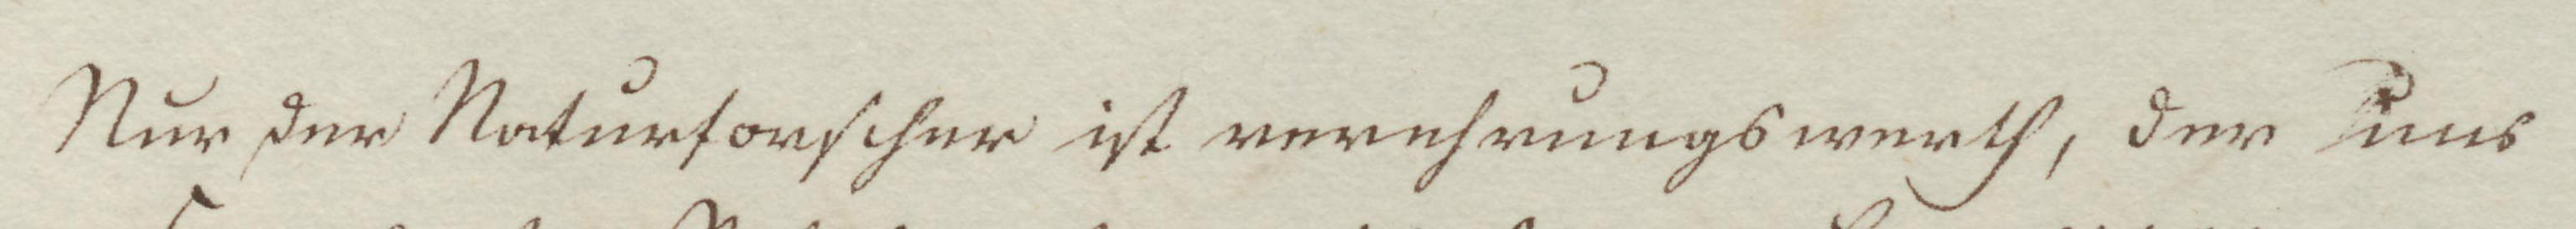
Nur der Naturforscher ist verehrungswerth, der uns
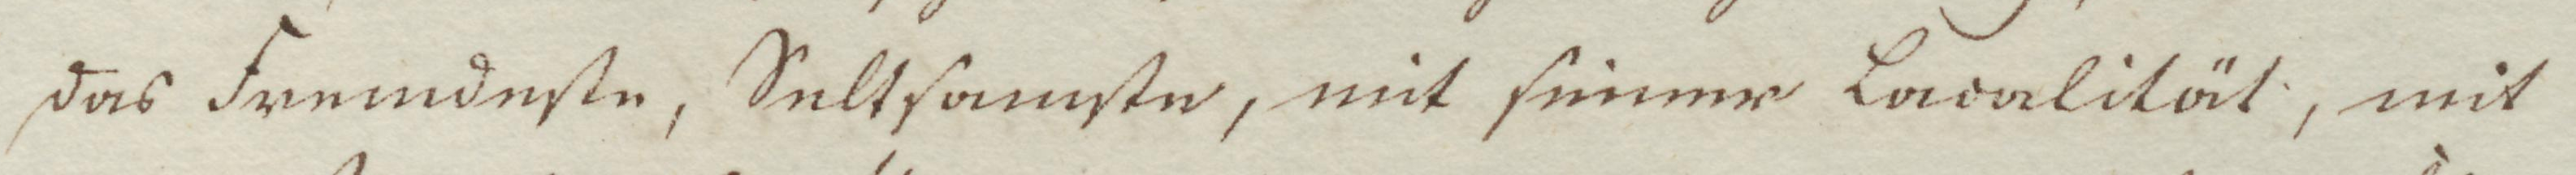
das Fremdeste, Seltsamste, mit seiner Localität, mit
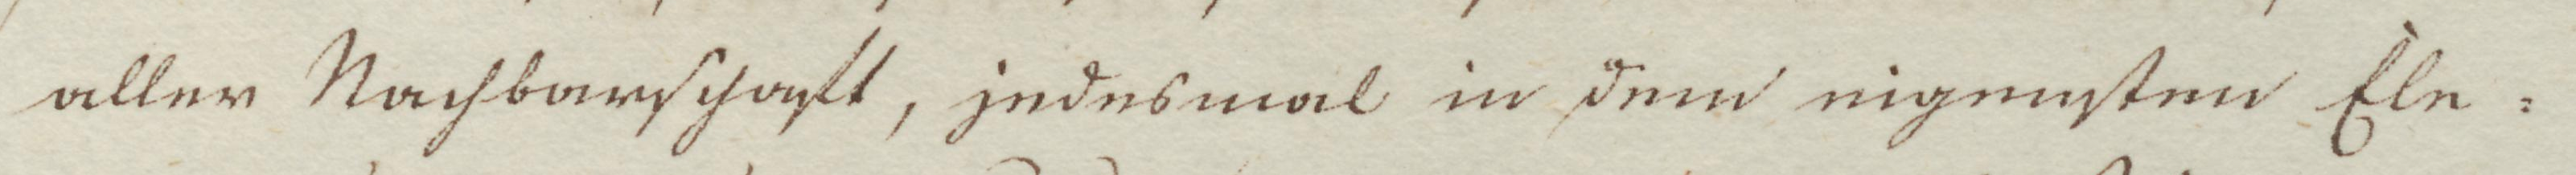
aller Nachbarschaft, jedesmal in dem eigensten Ele-
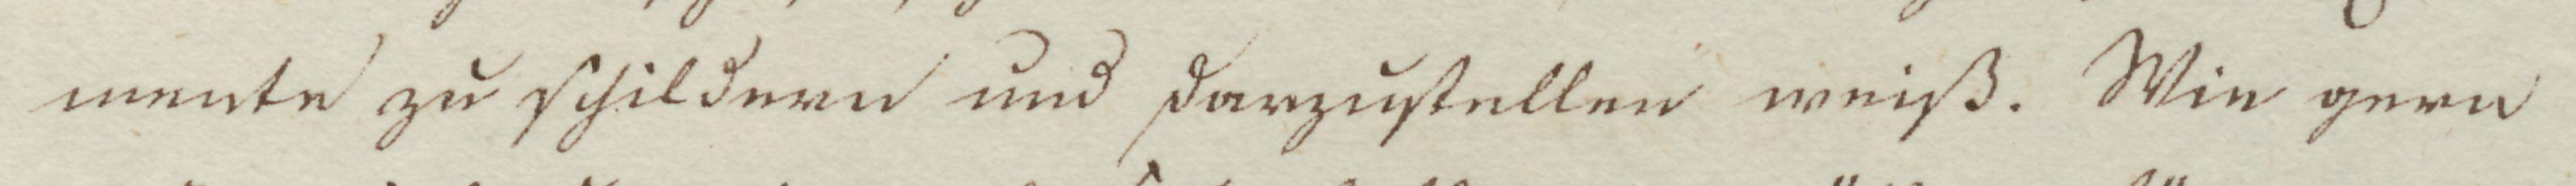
mente zu schildern und darzustellen weiß. Wie gern
